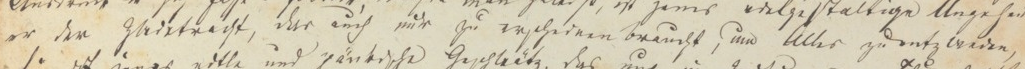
er der Zwietracht, das auch nur zu erscheinen braucht, um Alles zu entzweien,
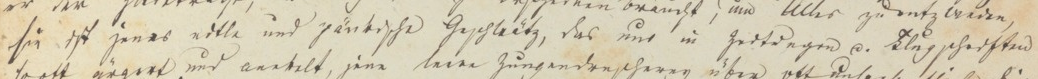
sie ist jenes eitle und zänkische Geschwätz, das uns in Zeitungen &. Flugschriften
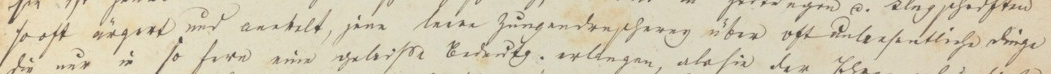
so oft ärgert und anekelt, jene leere Zungendrescherey über oft unwesentliche Dinge
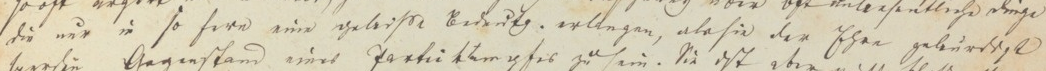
die nur in so fern eine gewisse Bedeutg. erlangen, als sie der Ehre gewürdigt
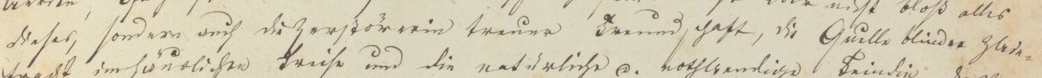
dieses, sondern auch die Zerstörerin treuer Freundschaft, die Quelle blinder Zwie-
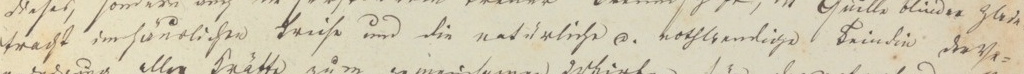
tracht im häuslichen Kreise und die natürliche &. nothwendige Feindin der Ve-
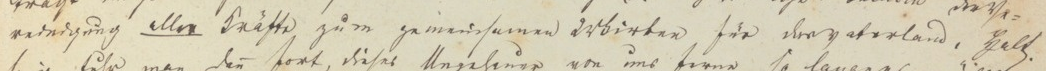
reinigung aller Kräfte zum gemeinsamen Wirken für das Vaterland. Halt.
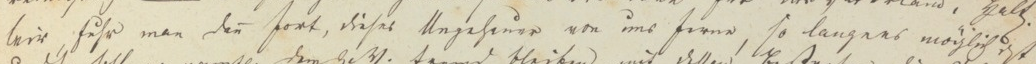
wir, fuhr man dann fort, dieses Ungeheuer von uns ferne, so lange es möglich ist,
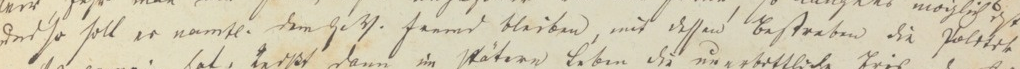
und so soll es namtl. dem Z.V. fremd bleiben, mit dessen Bestreben die Politik
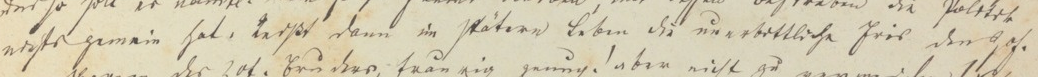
nichts gemein hat. Reißt dann im spätern Leben die unerbittliche Eris den Zof.
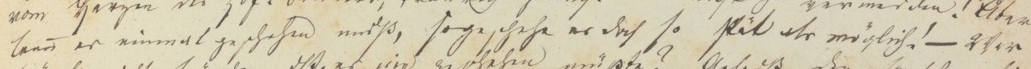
wenn es einmal geschehen muß, so geschehe es doch so spät als möglich! – Wer
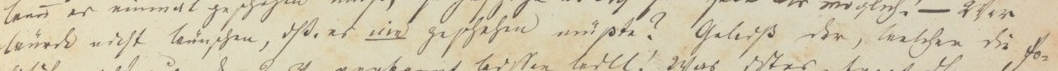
würde nicht wünschen, dß. es nie geschehen müßte? Gewiß der, welcher die Po-
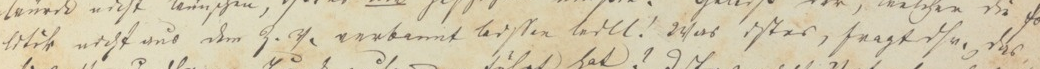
litik nicht aus dem Z.V. verbannt wissen will! Was ist es, fragt ihr, das
